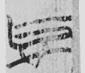○（辭）
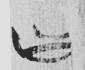曰
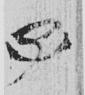子
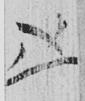之
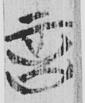言
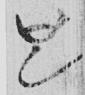也
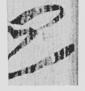巳
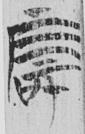砫（重）
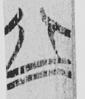丘
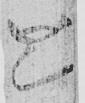也
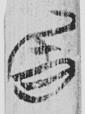昏
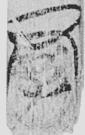君子
